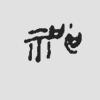神
